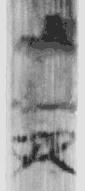四
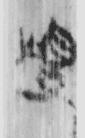{相又}
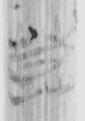莫
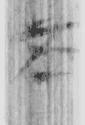不
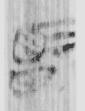{馬田}
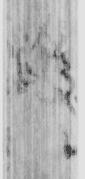{水禾又}
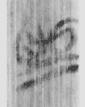爲
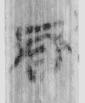君
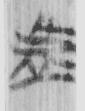者
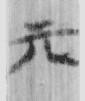亓
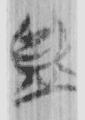監
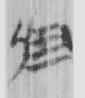於
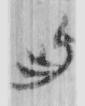此
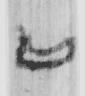㠯（以）
